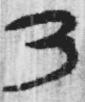乃
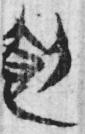飤（食）
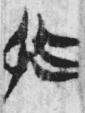於
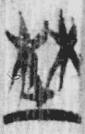埜（野）
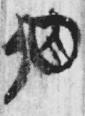○（宿）
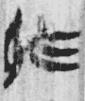於
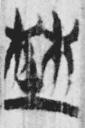埜（野）
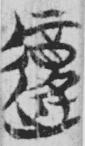○（復）
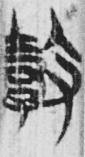○（穀）
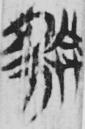豢
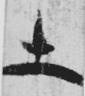土
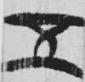五
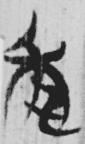年
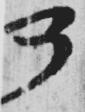乃
